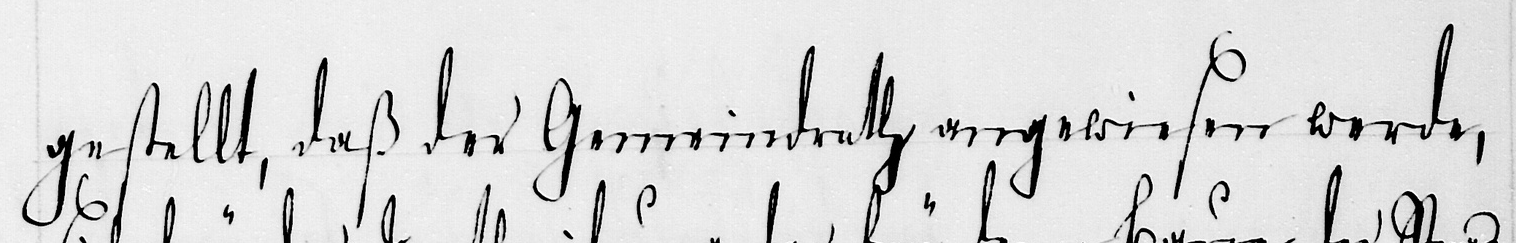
gestellt, daß der Gemeindrath angewiesen werde,
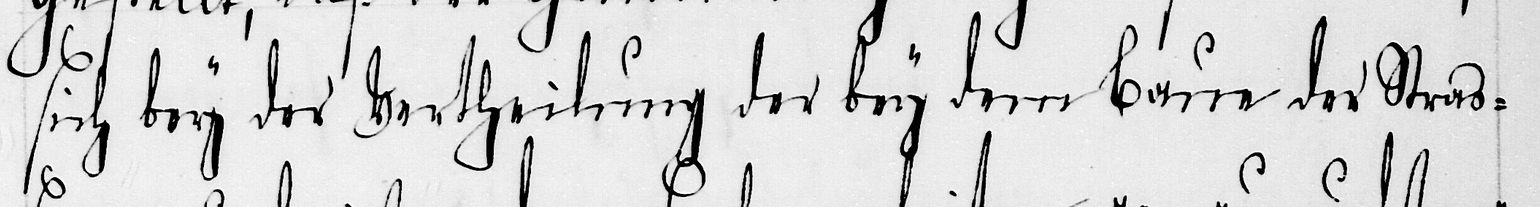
sich bey der Vertheilung der bey dem Baue der Stra¬
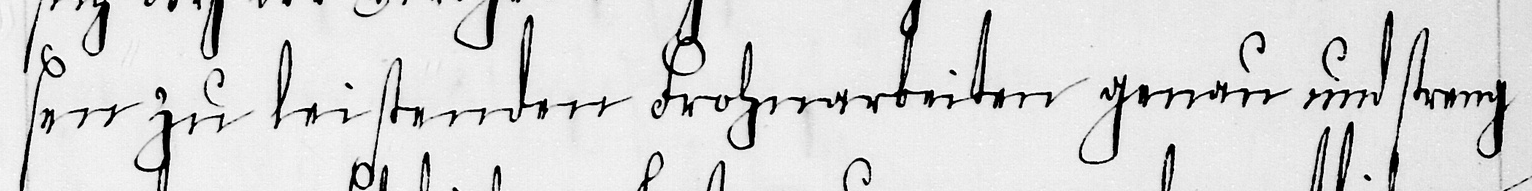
ßen zu leistenden Frohnarbeiten genau und streng
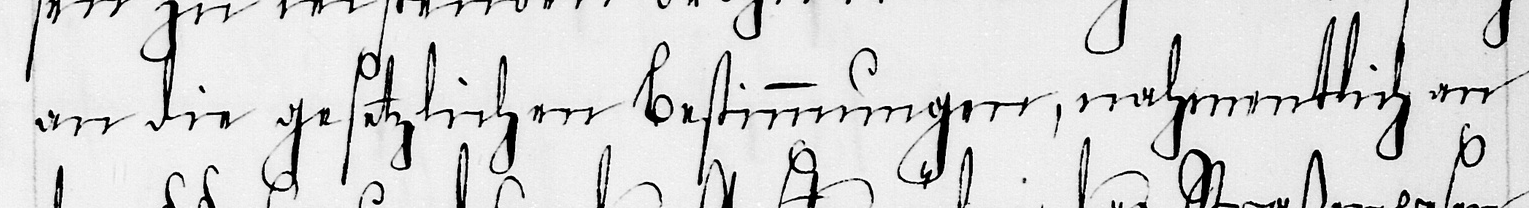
an die gesetzlichen Bestimmungen, nahmentlich an
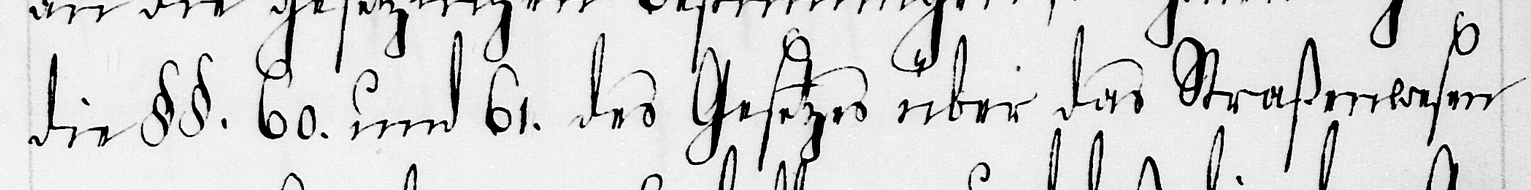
die §§. 60. und 61. des Gesetzes über das Straßenwesen
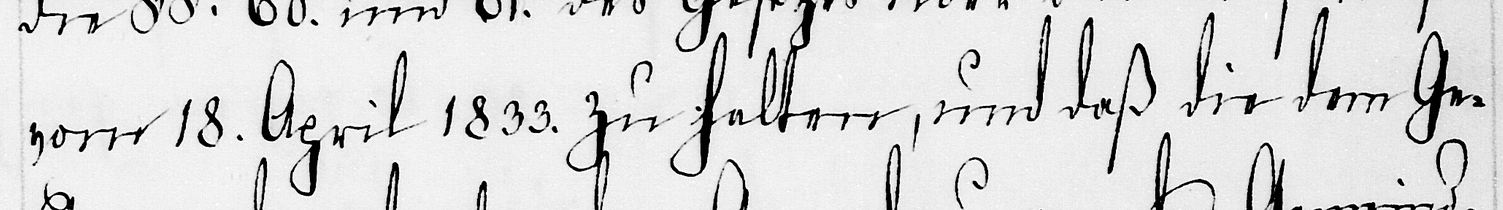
vom 18. April 1833. zu halten, und daß die dem Ge¬
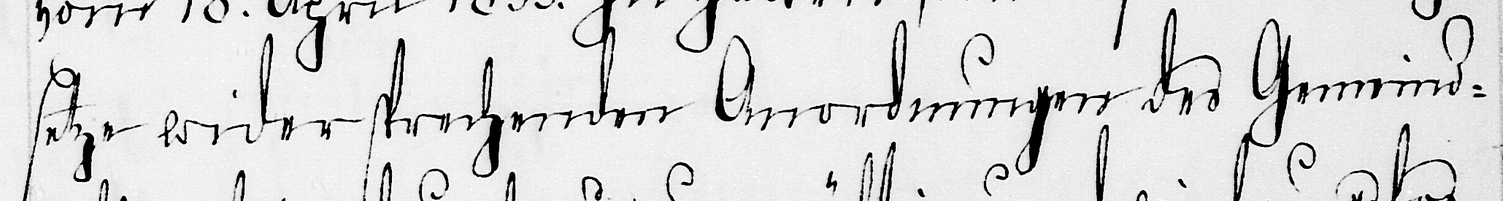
setze widersprechenden Anordnungen des Gemeind¬
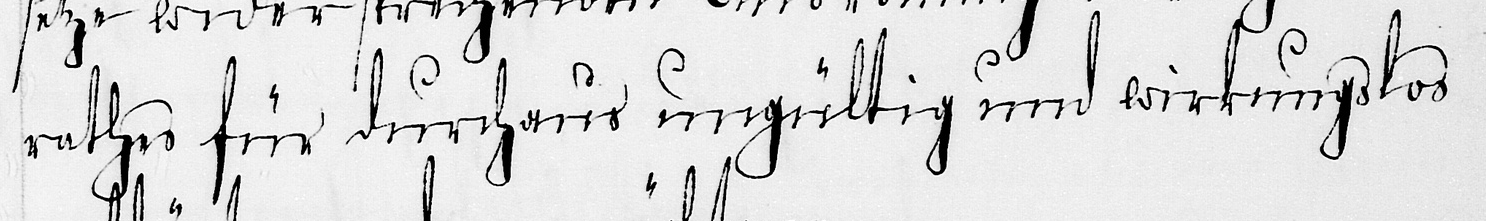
rathes für durchaus ungültig und wirkungslos
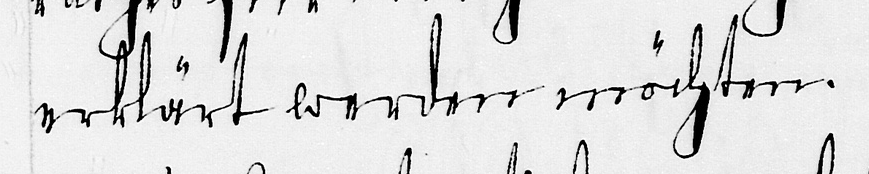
erklärt werden möchten.
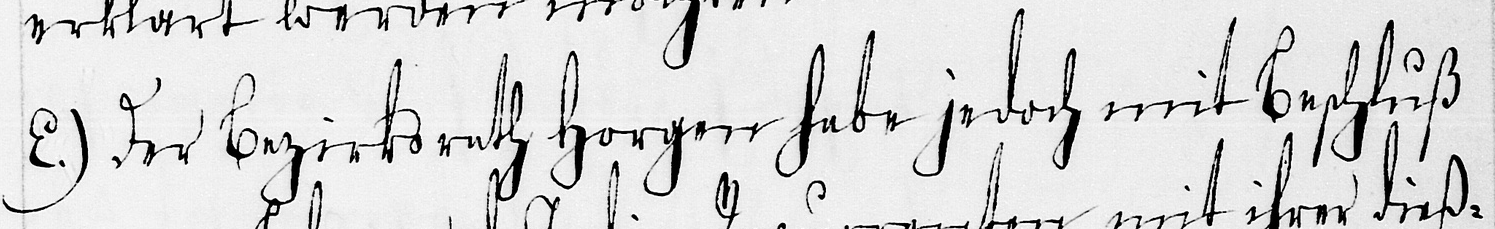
E.) Der Bezirksrath Horgen habe jedoch mit Beschluß
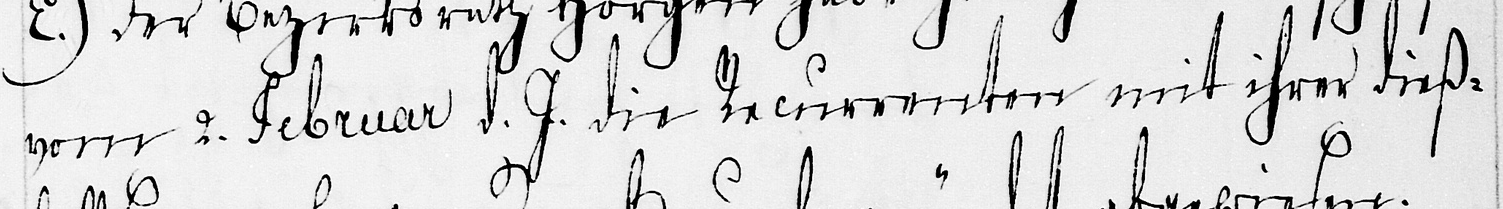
vom 2. Februar d. J. die Recurrenten mit ihrer dieß¬
